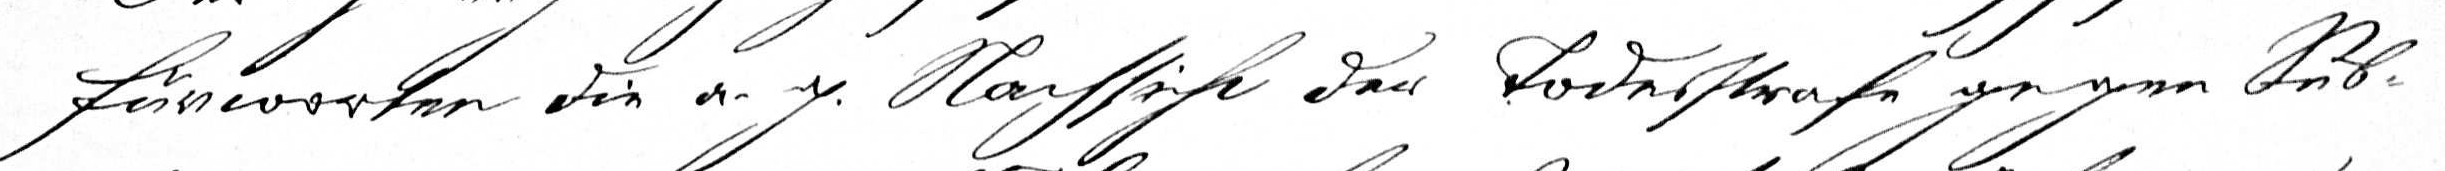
fürworten die a.g. Nachsicht der Todesstrafe gegen Sub¬
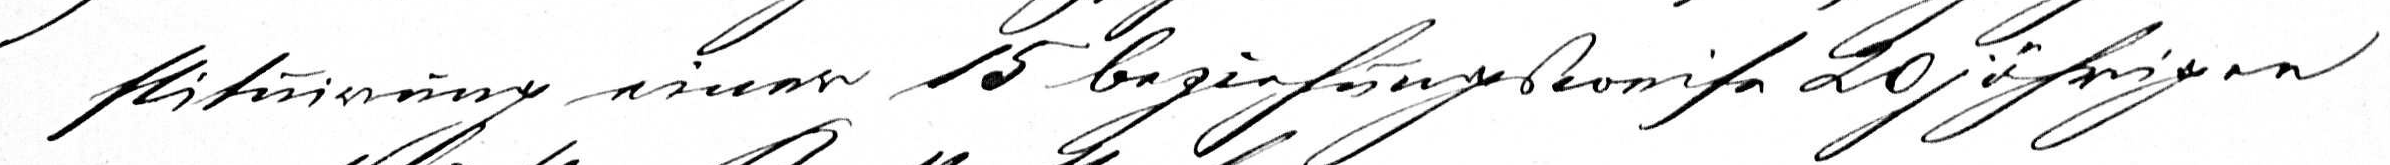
stituirung einer 15 beziehungsweise 20jährigen
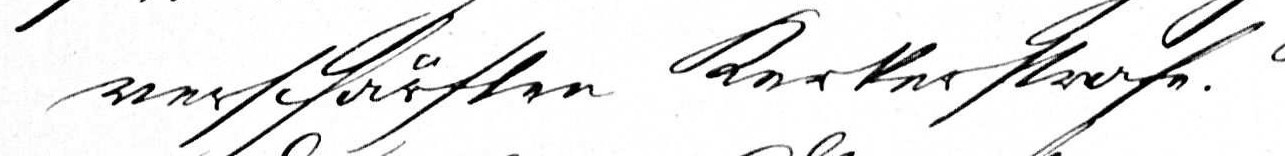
verschärften Kerkerstrafe.
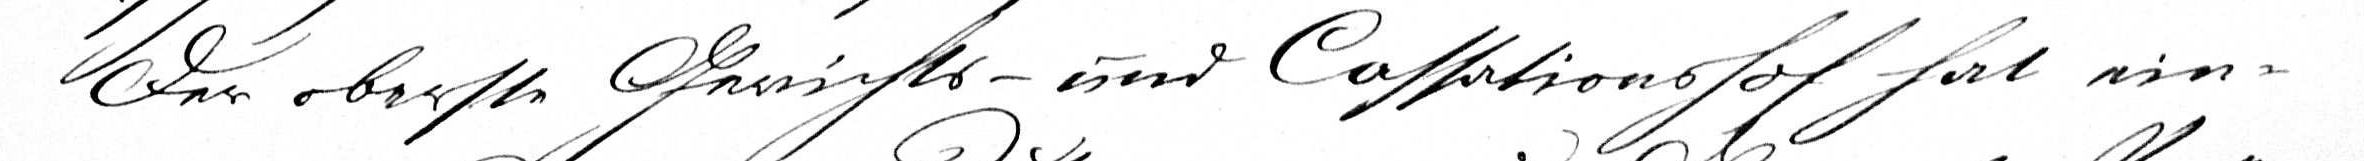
Der oberste Gerichts- und Cassationshof hat ein¬
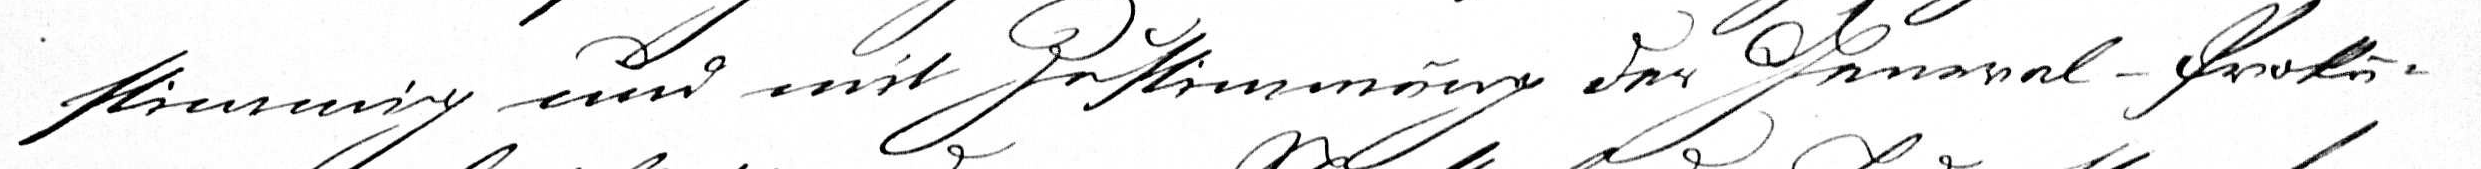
stimmig und mit Zustimmung der General-Proku¬
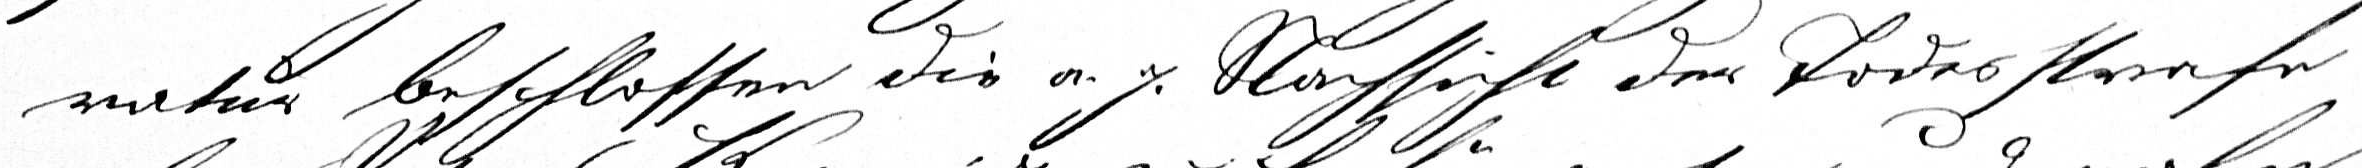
ratur beschlossen die a.g. Nachsicht der Todesstrafe
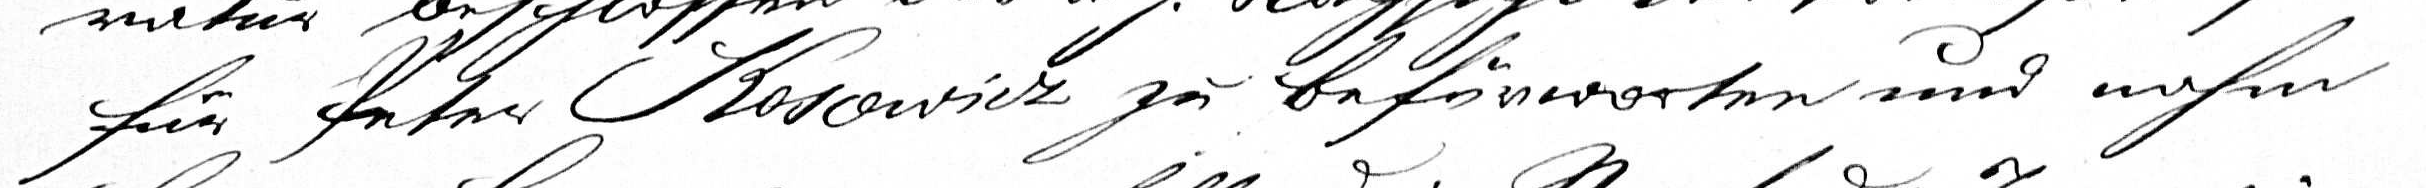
für Peter Kosowicz zu befürworten und nahm
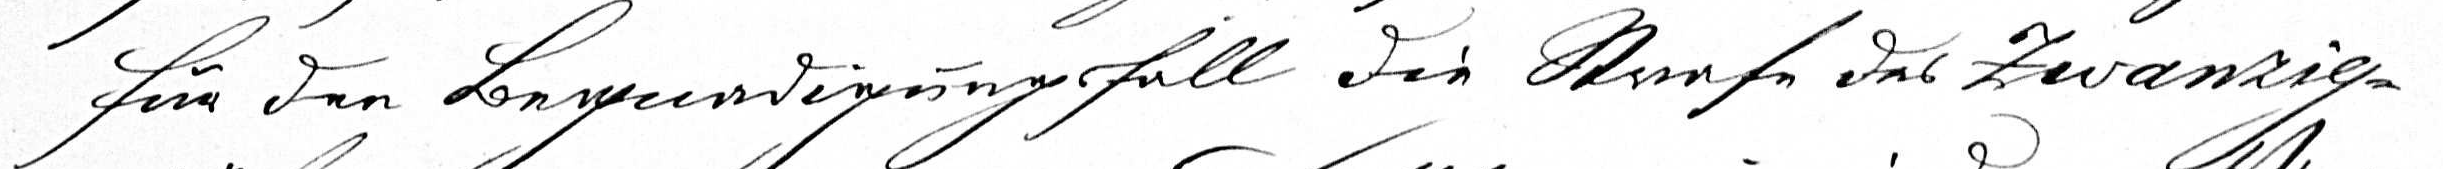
für den Begnadigungsfall die Strafe des zwangzig¬
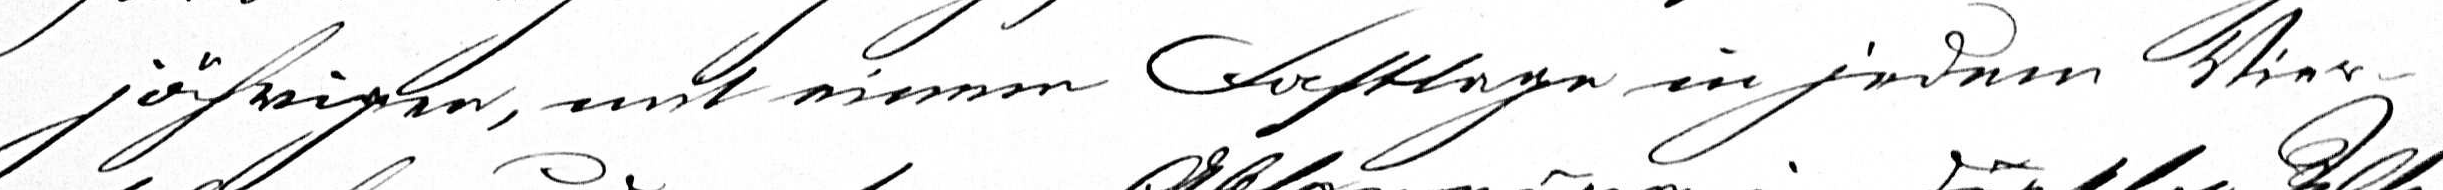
jährigen, mit einem Fasttage in jedem Vier¬
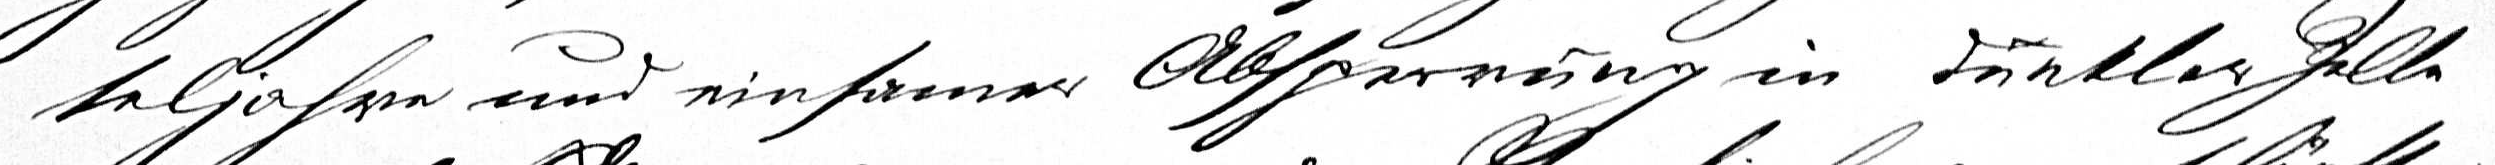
teljahre und einsamer Absperrung in dunkler Zelle
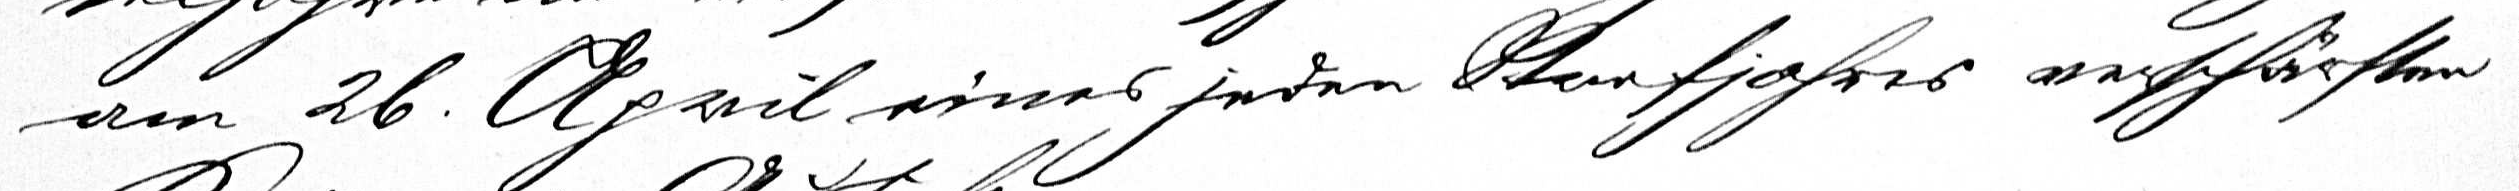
am 26. April eines jeden Strafjahres verschärften
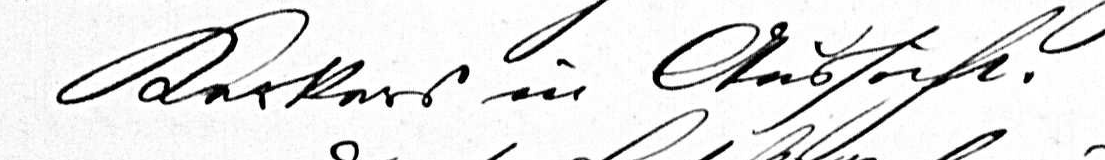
Kerkers in Aussicht.
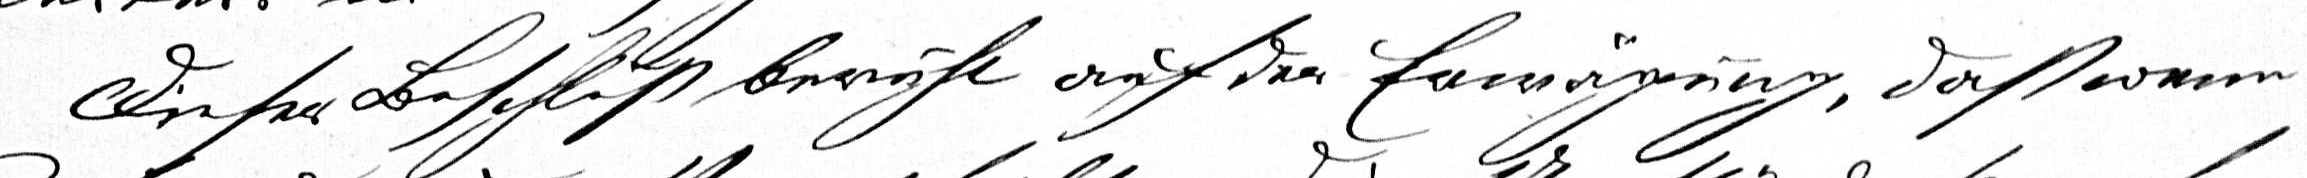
Dieser Beschluß beruht auf der Erwägung, daß wenn
